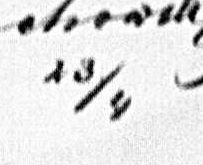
23/4
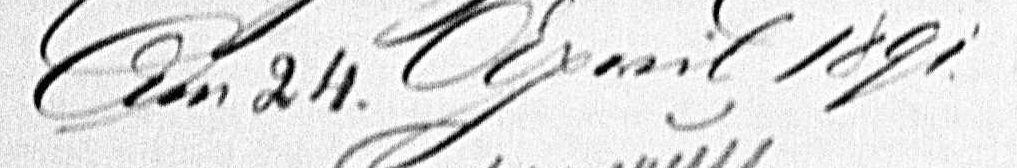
Am 24. April 1891
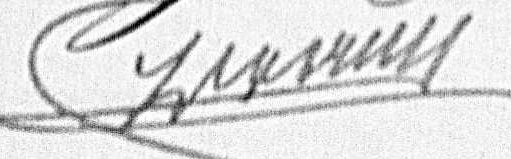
Wraun
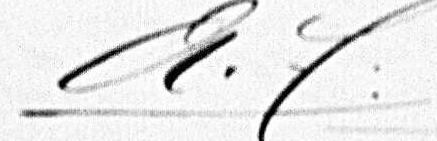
AE
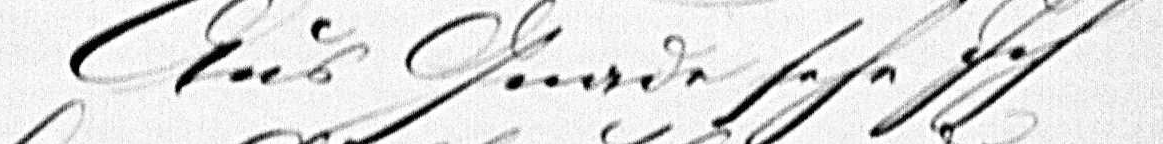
Aus Gnade sehe Ich
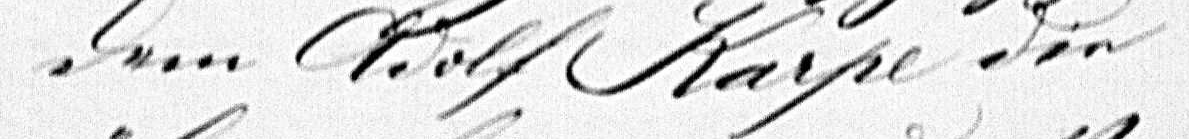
dem Adolf Karpe die
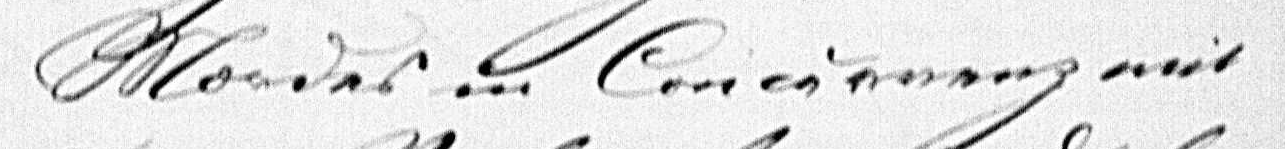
Mordes in Concurrenz mit
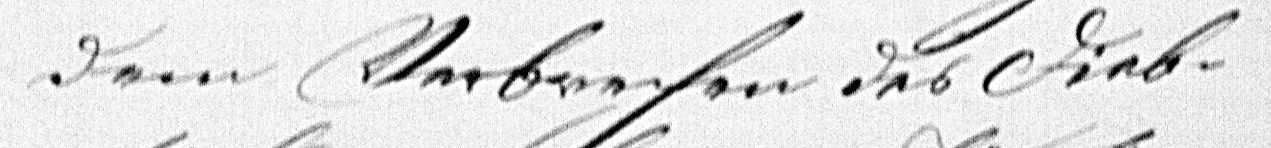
dem Verbrechen des Dieb¬
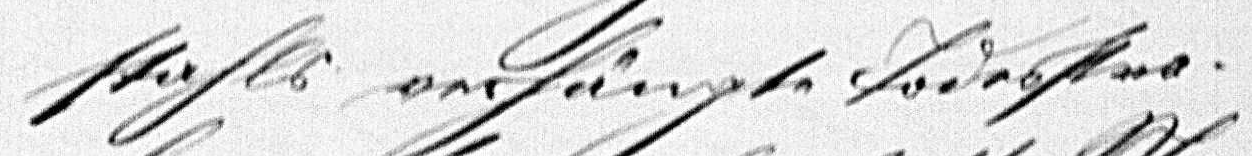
stahls verhängte Todesstra¬
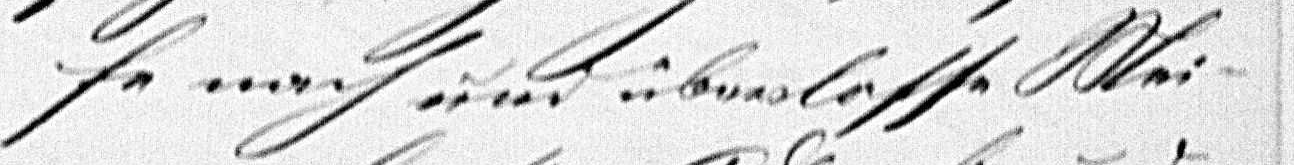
fe nach und überlasse Mei¬
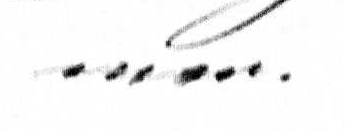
men.
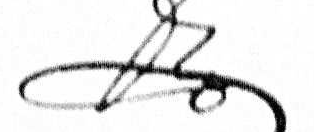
FJ
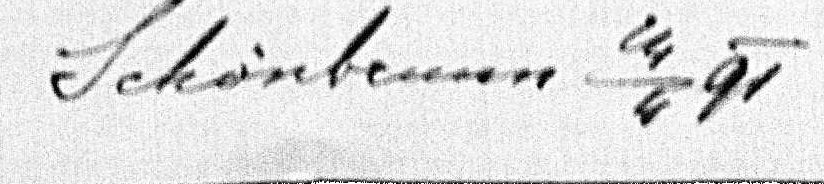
Schönbrunn 24/4/1891
